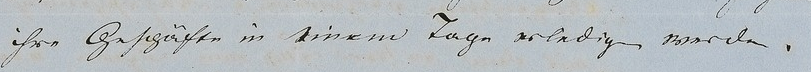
ihre Geschäfte in einem Tage erledigen werde.
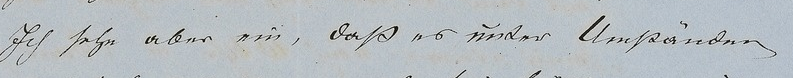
Ich sehe aber ein, daß es unter Umständen
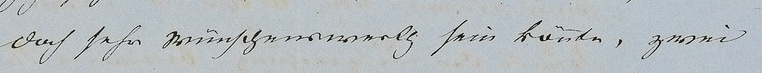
doch sehr wünschenswerth sein könnte, zwei
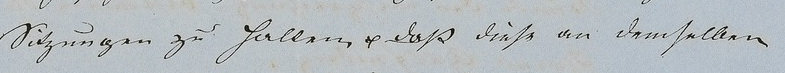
Sitzungen zu halten & daß diese an demselben
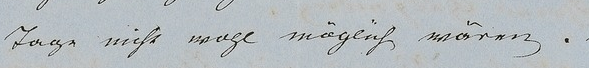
Tage nicht wohl möglich wären. –
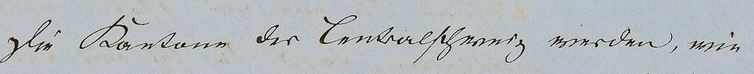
Die Kantone der Centralschweiz werden, wie
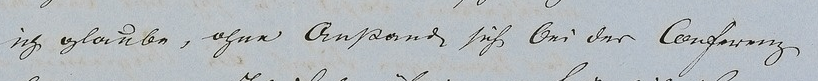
ich glaube, ohne Anstand sich bei der Conferenz
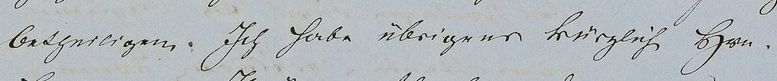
betheiligen. Ich habe übrigens kürzlich Hrn.
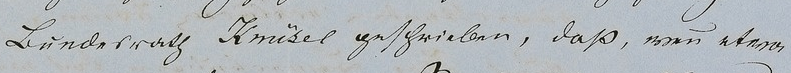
Bundesrath Knüsel geschrieben, daß, wenn etwa
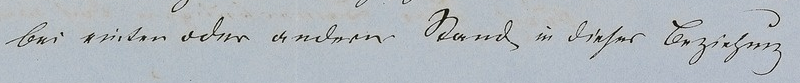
bei einten oder andern Stand in dieser Beziehung
